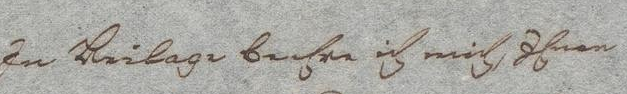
In Beilage beehre ich mich, Ihnen
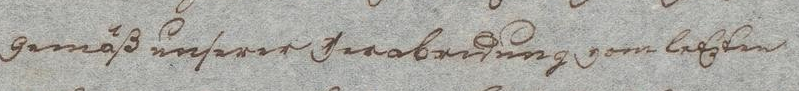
gemäß unserer Verabredung vom letzten
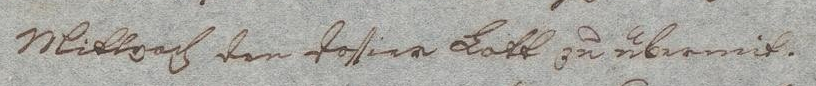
Mitwoch den Dossier Lott zu übermit-
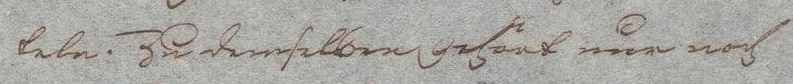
teln. Zu demselben gehört nur noch
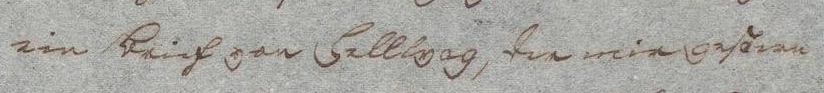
ein Brief von Hellwag, der mir gestern
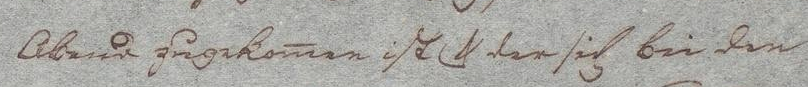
Abend zugekommen ist & der sich bei den
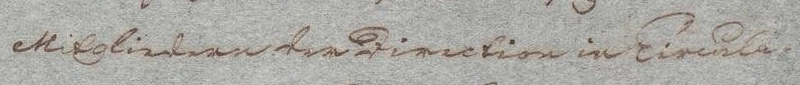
Mitgliedern der Direction in Circula-
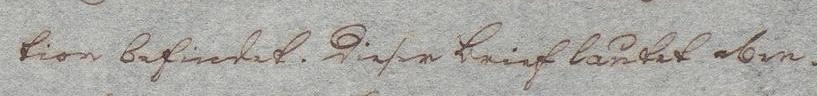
tion befindet. Dieser Brief lautet eben-
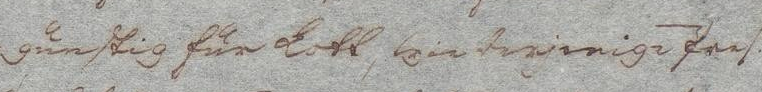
günstig für Lott, wie derjenige Pres-
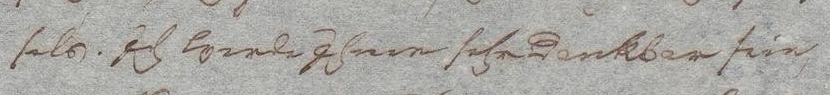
sels. Ich werde Ihnen sehr dankbar sein,
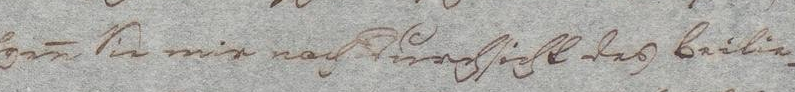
wenn Sie mir nach Durchsicht des beilie-
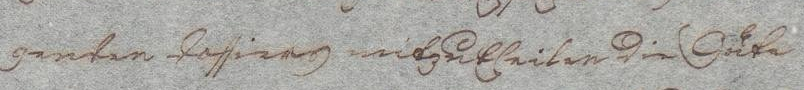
genden Dossiers mitzutheilen die Güte
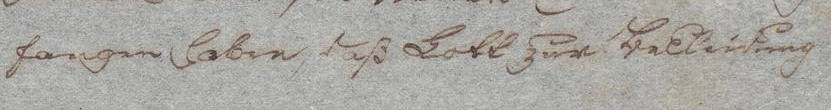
fangen haben, daß Lott zur Bekleidung
